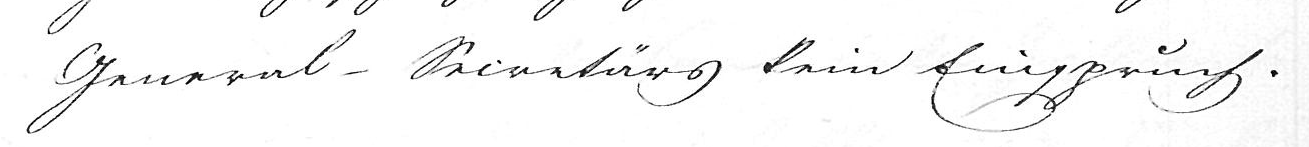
General-Secretärs kein Einspruch.
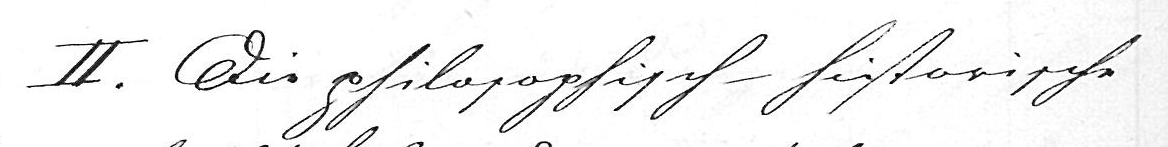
II. Die philosophisch-historische
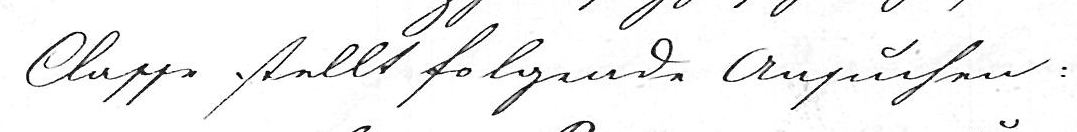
Classe stellt folgende Ansuchen:
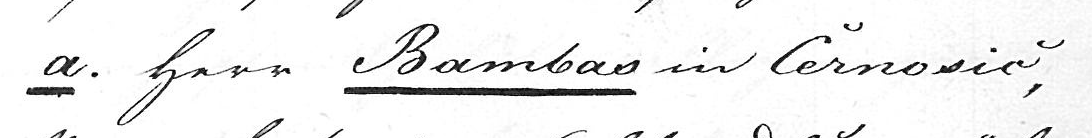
a. Herr Bambas in Cernosic
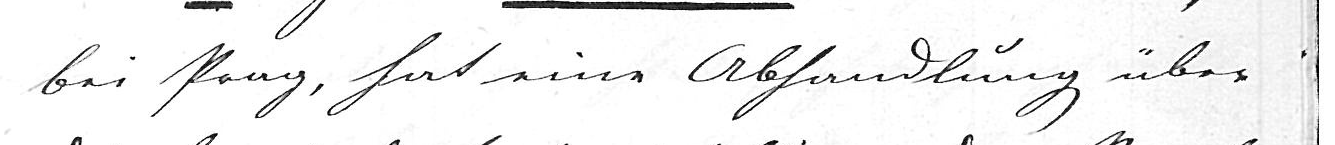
bei Prag, hat eine Abhandlung über
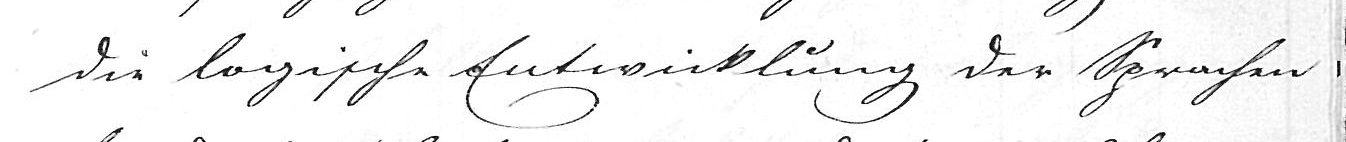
die logische Entwicklung der Sprachen
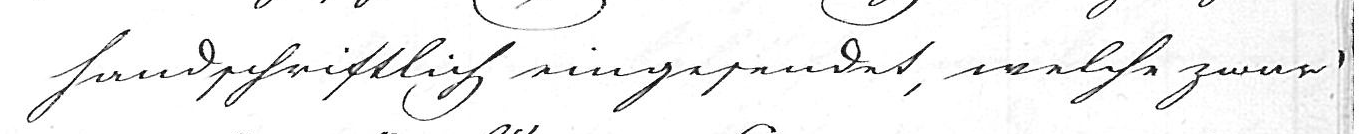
handschriftlich eingesendet, welche zwar
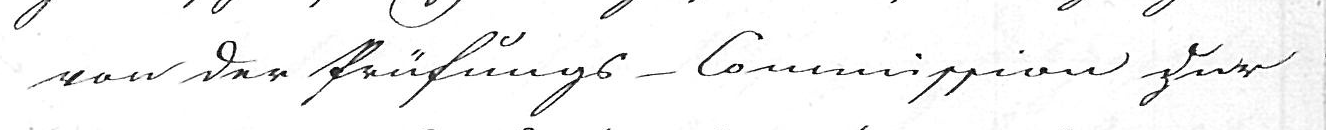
von der Prüfungs-Commission zur
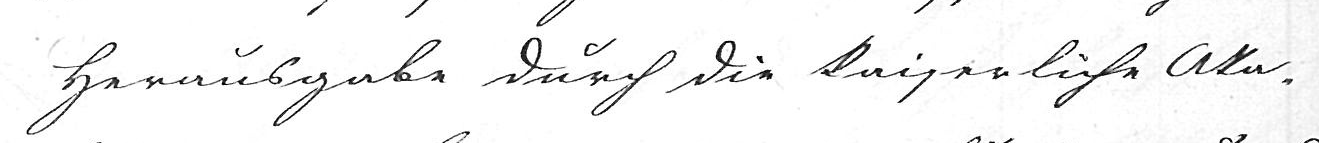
Herausgabe durch die kaiserliche Aka-
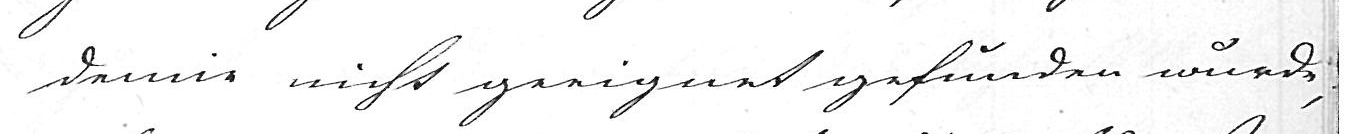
demie nicht geeignet gefunden wurde,
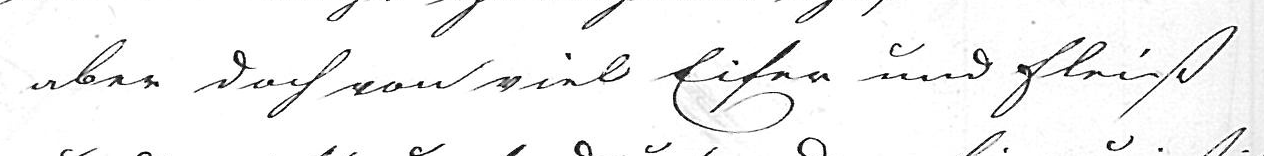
aber doch von viel Eifer und Fleiß
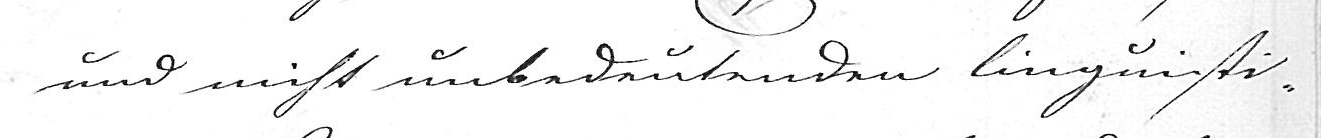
und nicht unbedeutenden linguisti-
